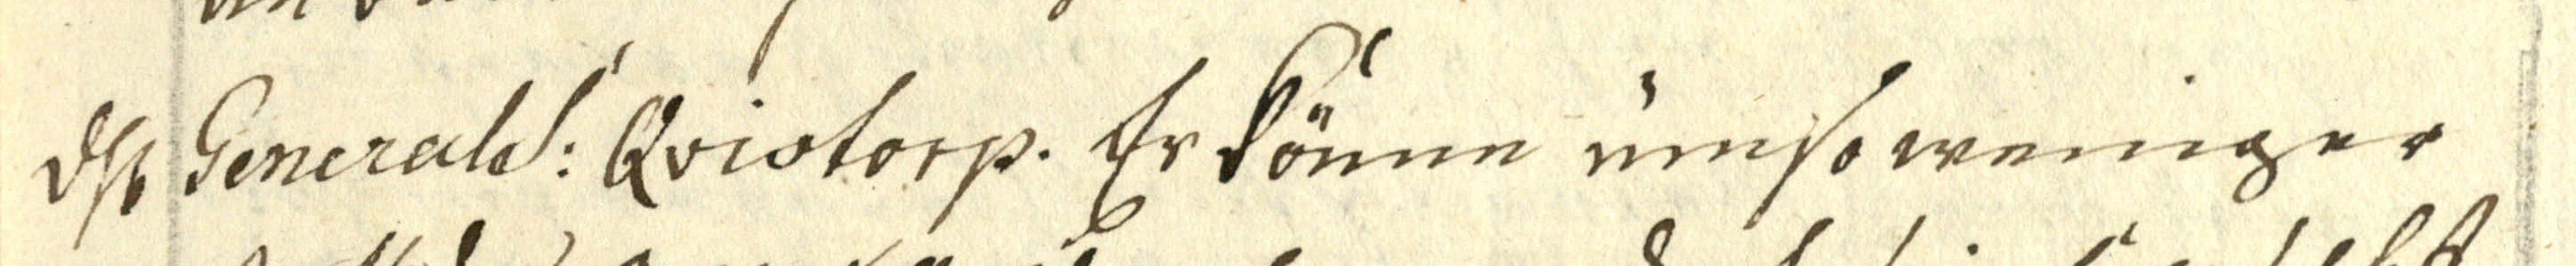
dh. GeneralS. Quistorp. Er könne ein so weniger
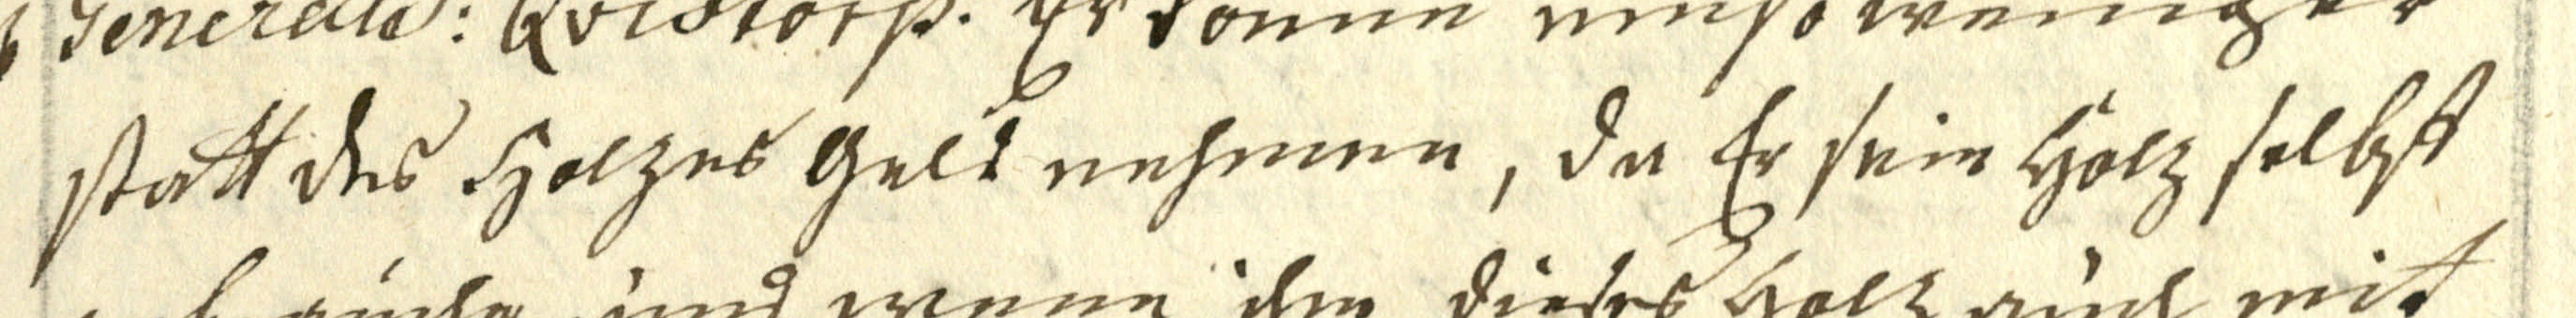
statt des Holzes Geld nehmen, da Er sein Holz selbst
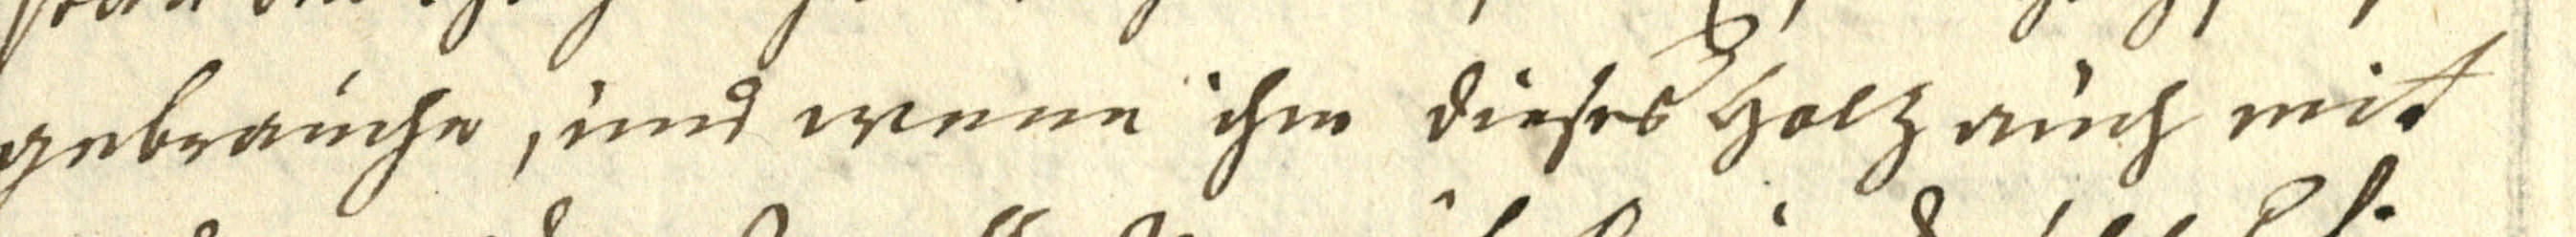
gebrauche, und wenn ihm dieses Holz auch mit
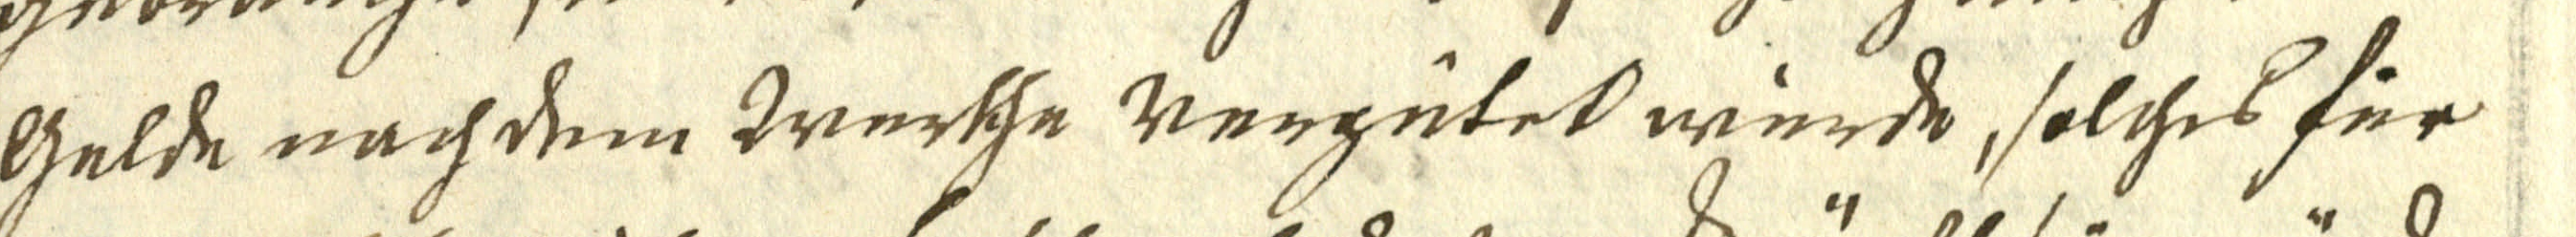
Gelde nach dem Werthe vergütet würde, solches für
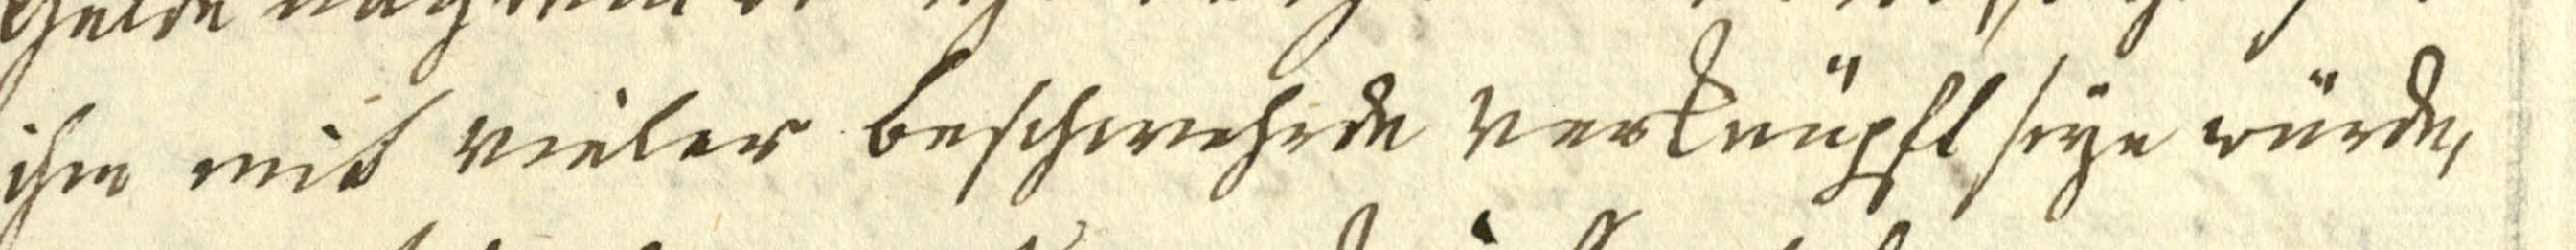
ihm mit vieler Beschwehrde verknüpft seÿn würde,
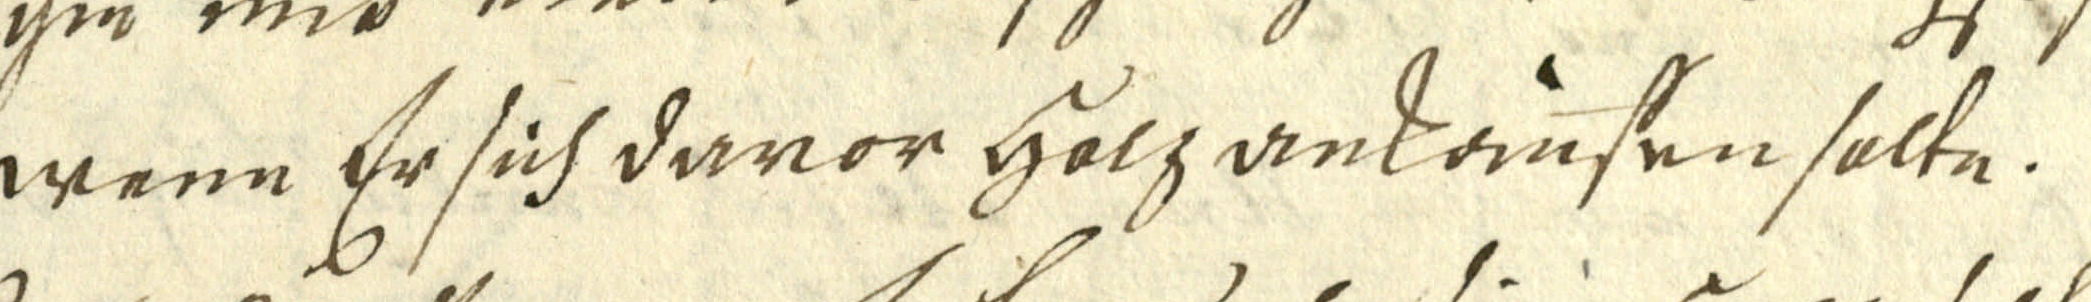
wenn Er sich davor Holz eankaufen solte.
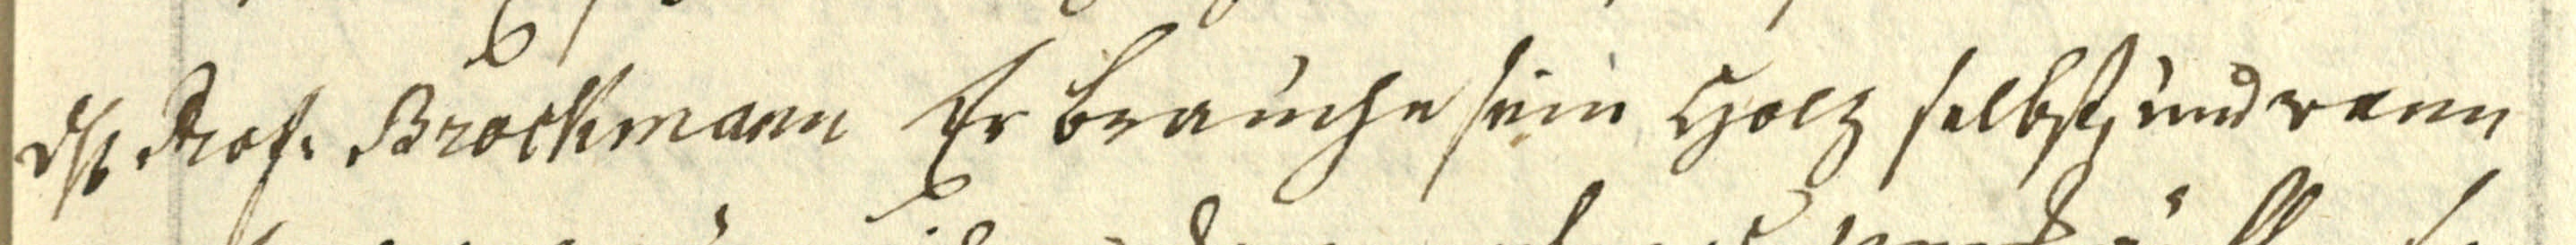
dh Prof. Brockmann Er brauche sein Holz selbst und wenn
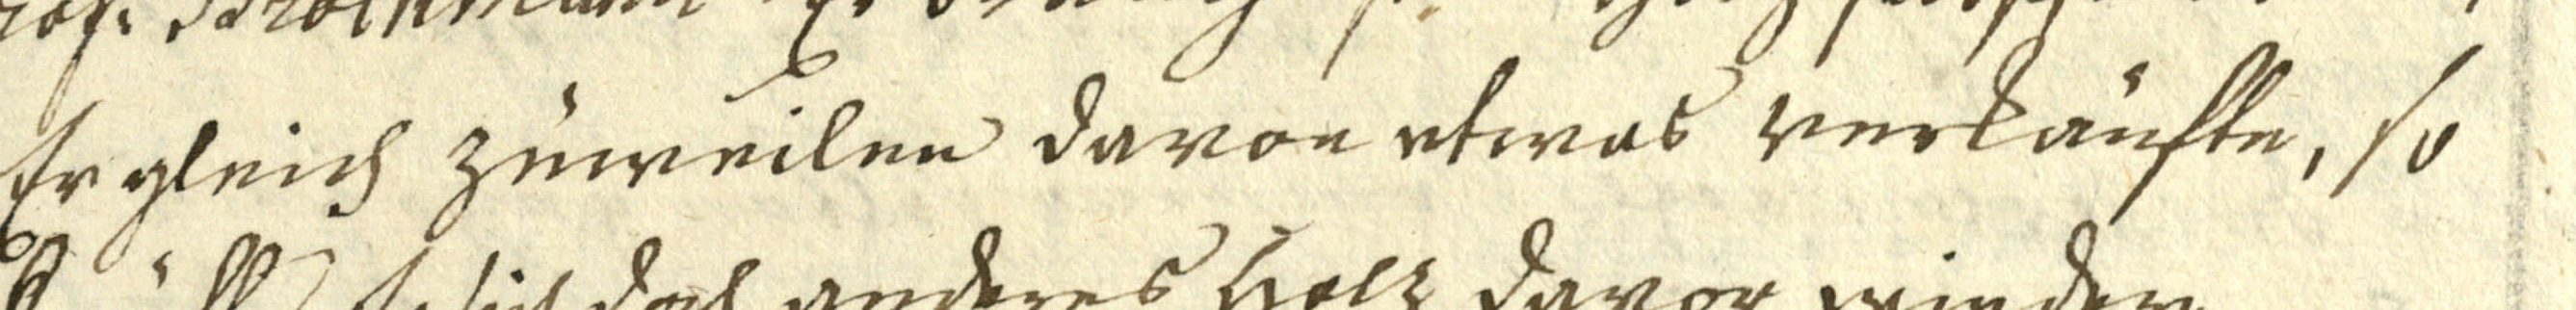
Er gleich zuweilen davon etwas verkaufte, so
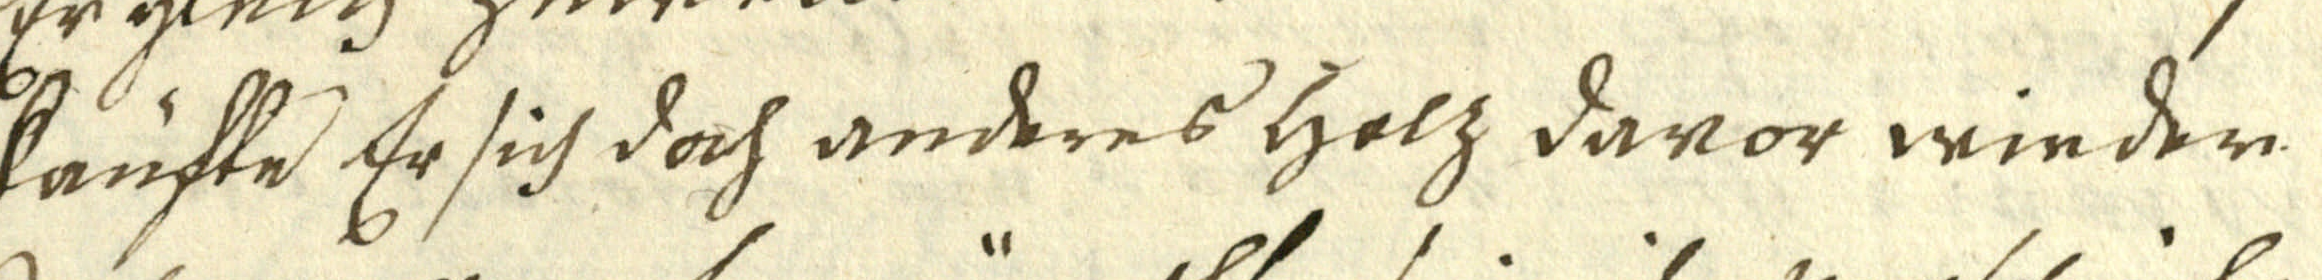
kaufte Er sich doch anderes Holz davor wieder.
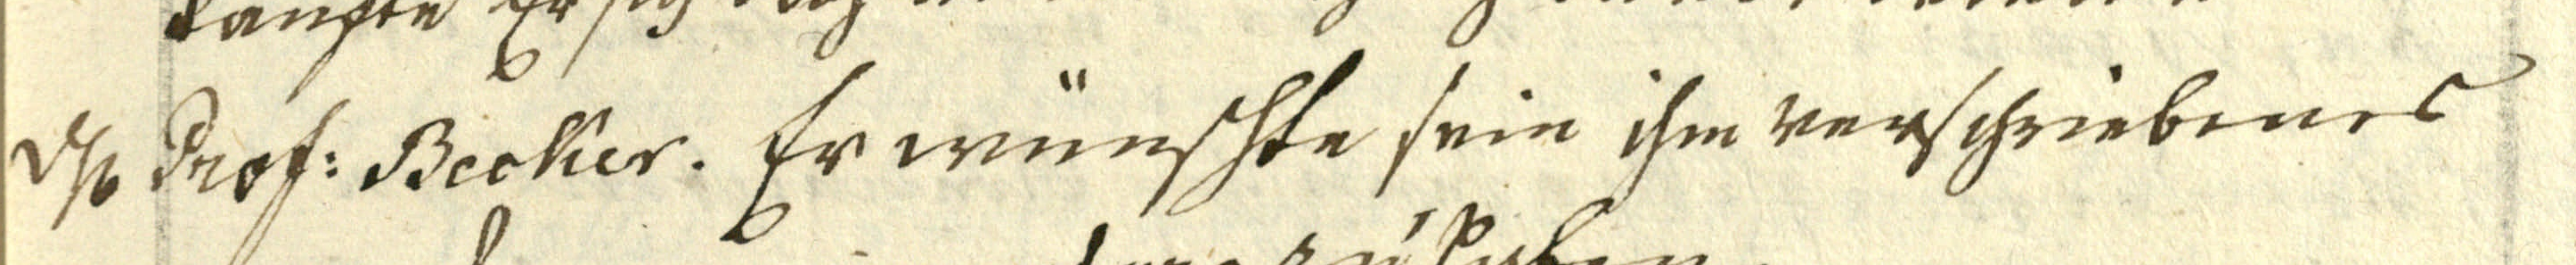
dh Prof. Becker. Er wünschte sein Ihm verschriebenes
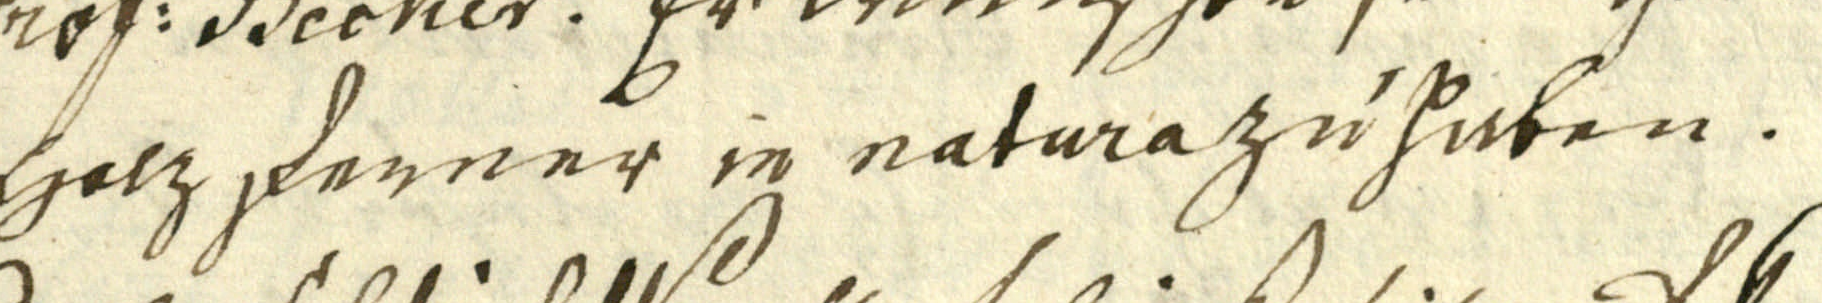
Holz ferner in natura zu haben.
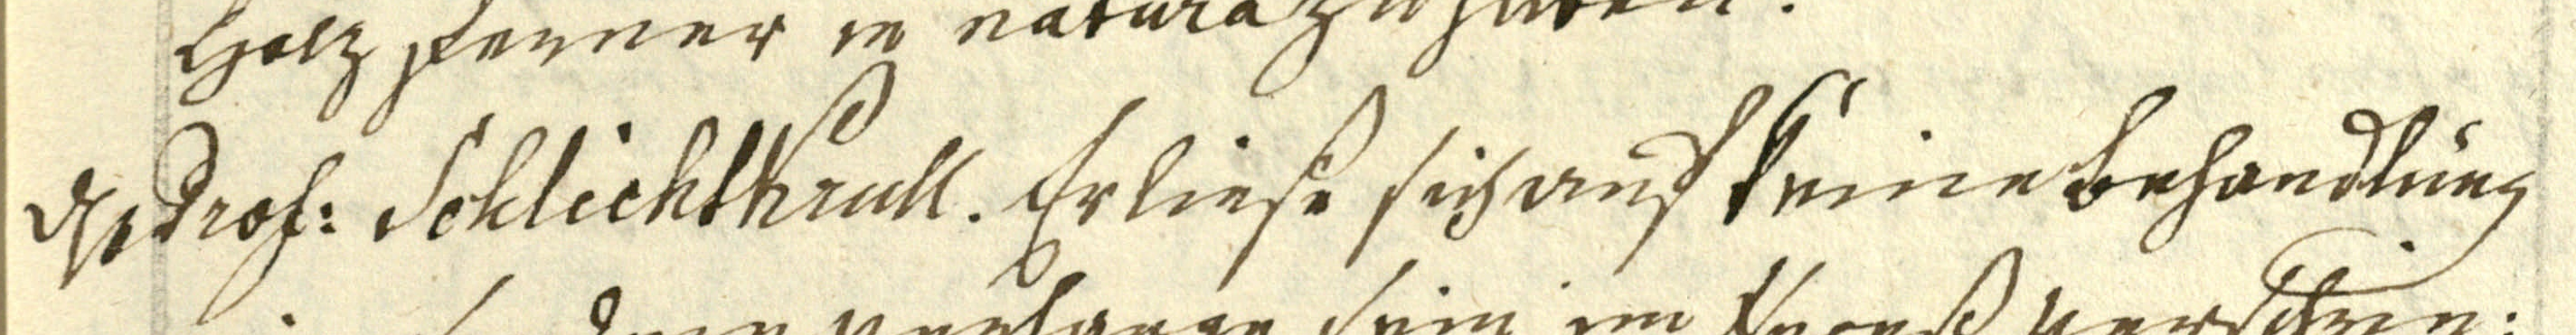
dh Prof. Schlichtkrull. Es ließe sich auf keine Behandlung
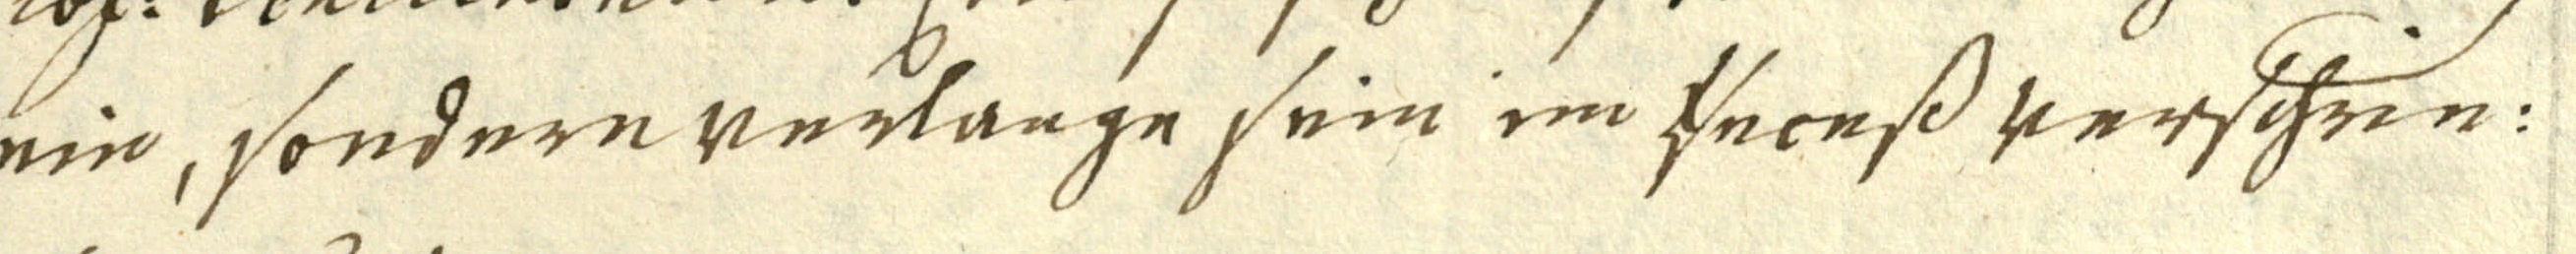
ein, sondern verlange sein im Receß verschrie¬
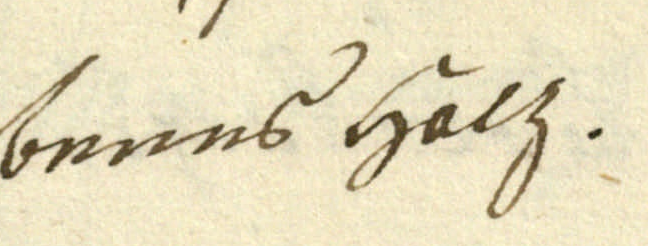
benes Holz.
